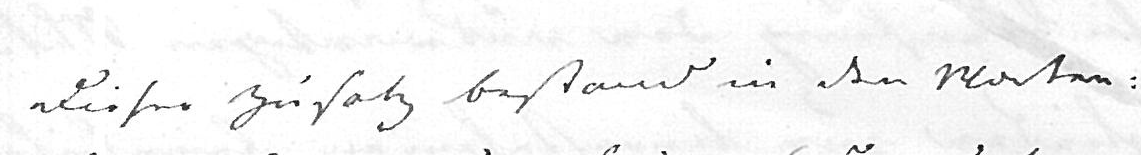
dieser Zusatz bestand in den Worten:
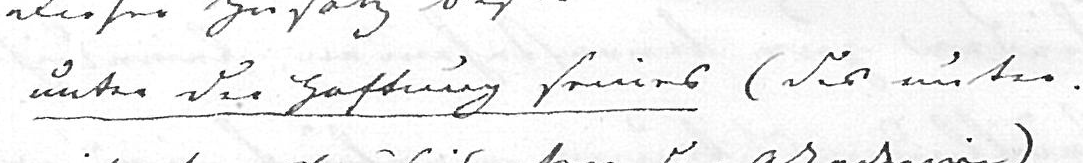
unter der Haftung seines (des unter-
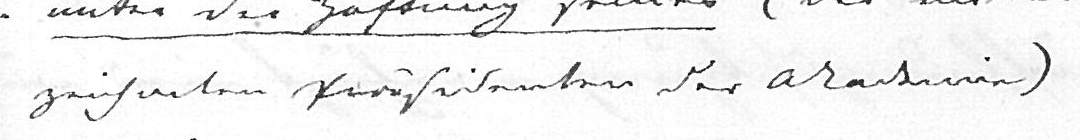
zeichneten Präsidtenten der Akademie)
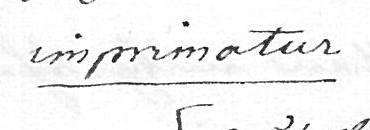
imprimatur
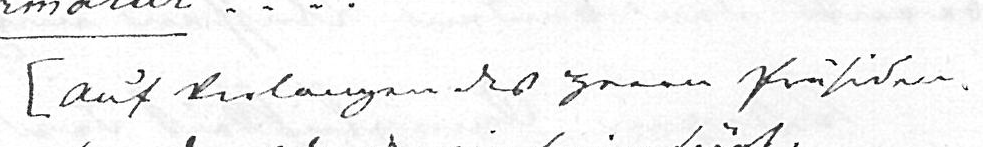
[auf Verlangen des Herrn Präsiden-
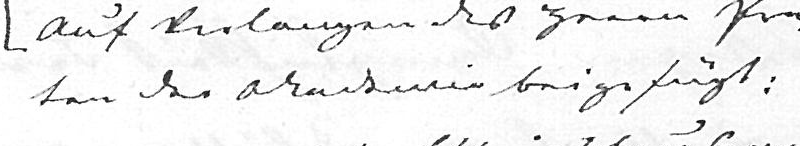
ten der Akademie beigefügt.
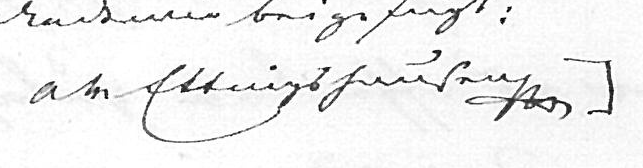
Av. Ettingshausen
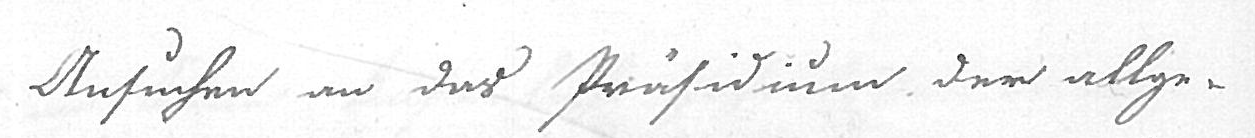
Ansuchen an das Präsidium der allge-
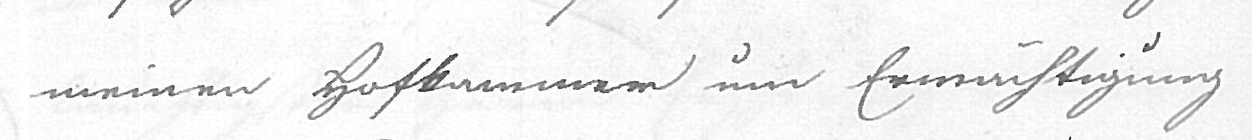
meinen Hofkammer um Ermächtigung
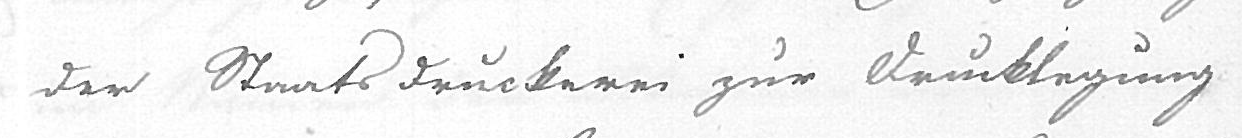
der Staatsdruckerei zur Drucklegung
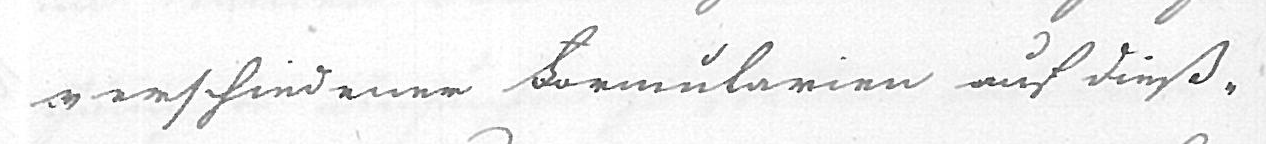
verschiedener Formularien auf dienst-
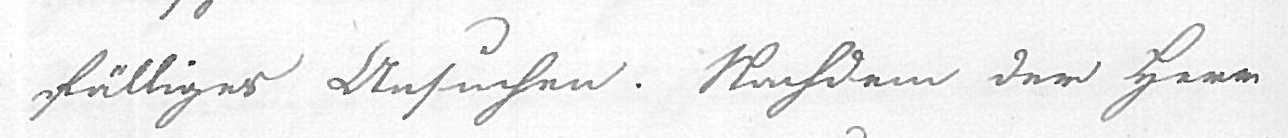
fälliges Ansuchen. Nachdem der Herr
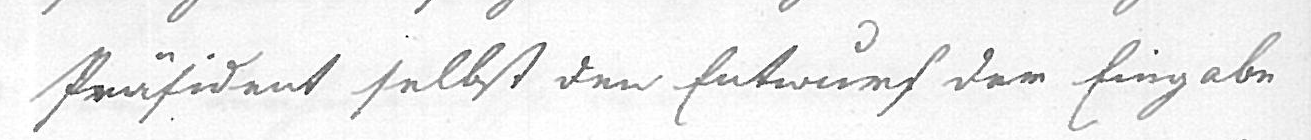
Präsident selbst den Entwurf der Eingabe
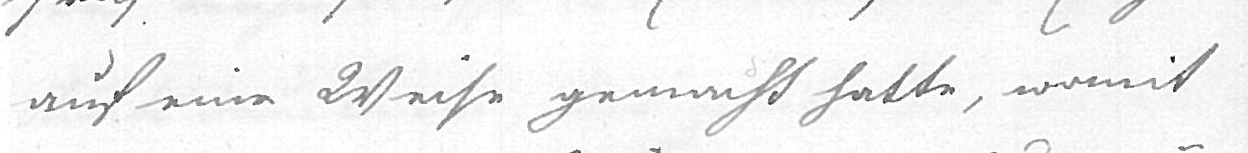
auf eine Weise gemacht hatte, womit
